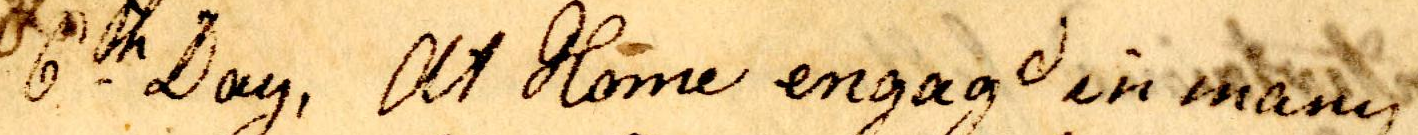6^th Day, At Home engag^d in many
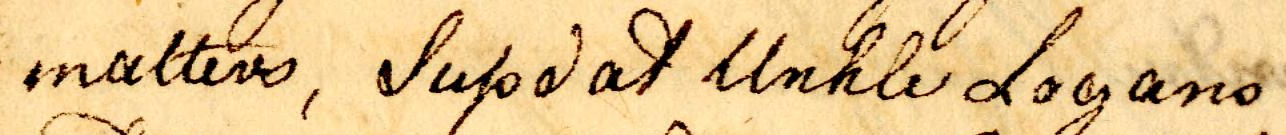matters, Supd at Unkle Logans
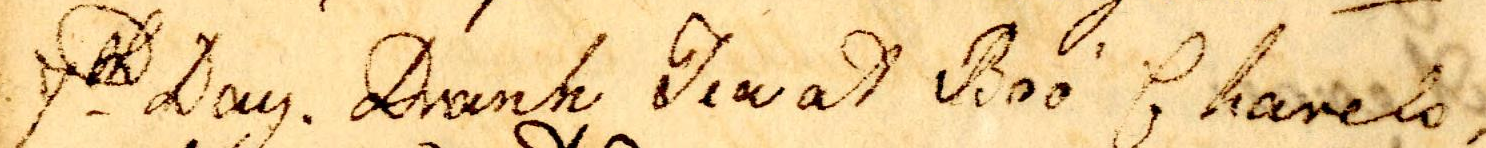7^th Day. Drank Tea at Bro' Charels,
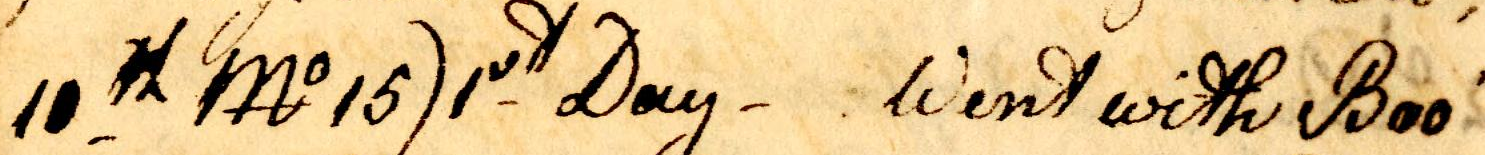10^th M^o 15) 1^st Day- Went with Bro'
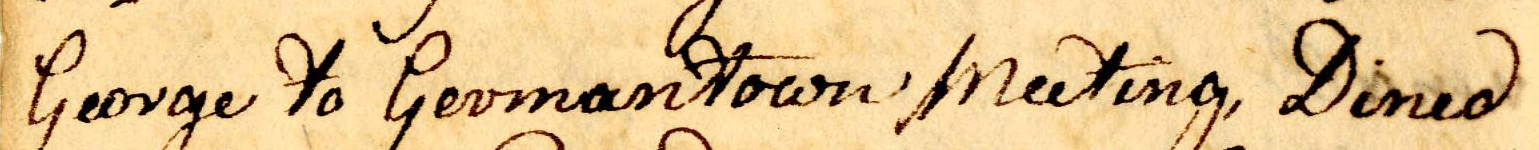George to Germantown Meeting, Dined
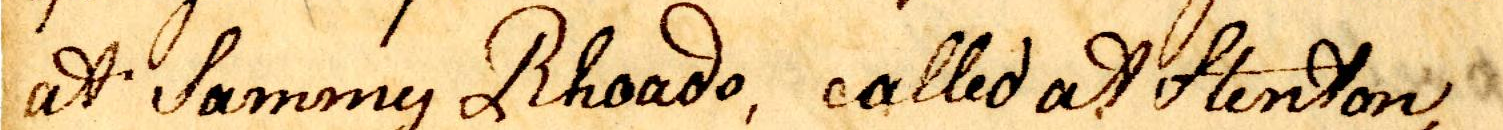at Sammy Rhoads, called at Stenton,
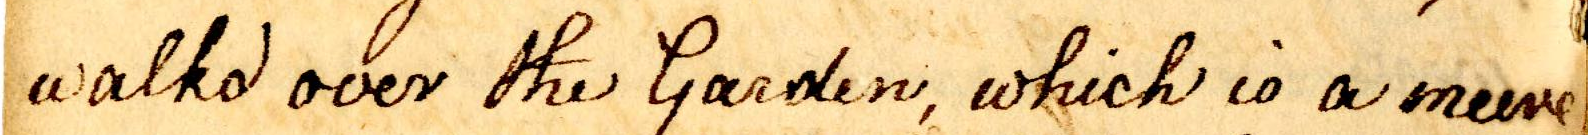walkd over the Garden, which is a meere
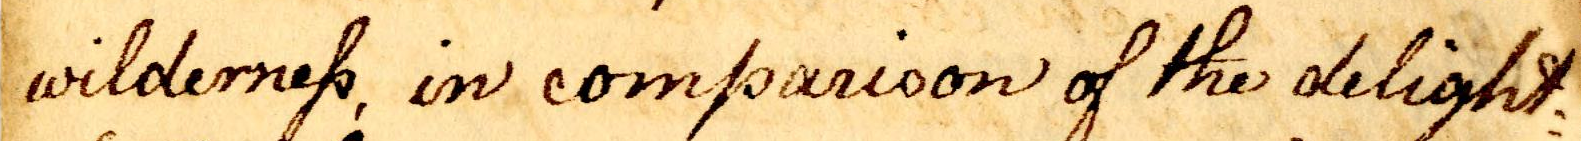wilderness, in comparison of the delight-
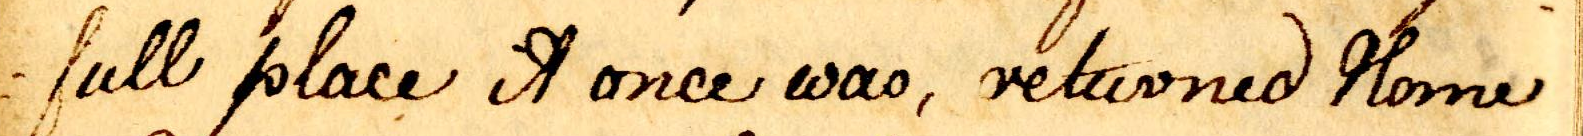-full place it once was, returned Home
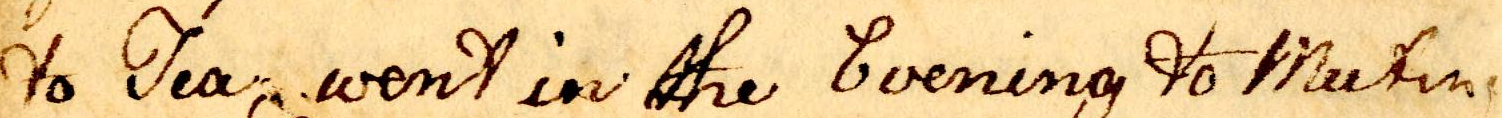to Tea, went in the Evening to Meeting
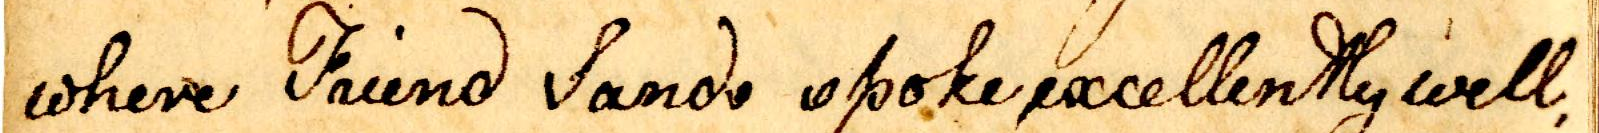where Friend Sands spoke excellently well,
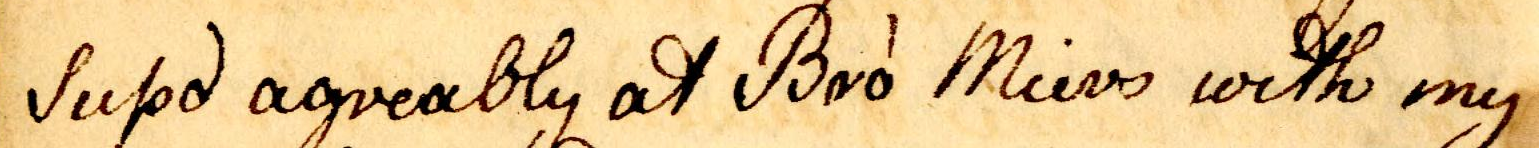Supd agreably at Bro' Miers with my
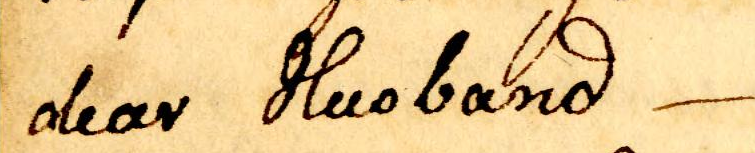dear Husband-
